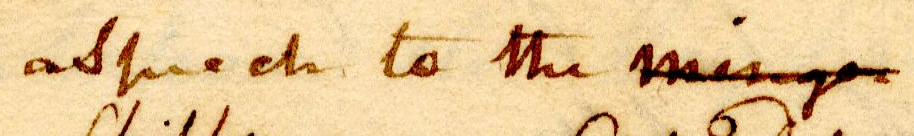a Speech to the Mingoes
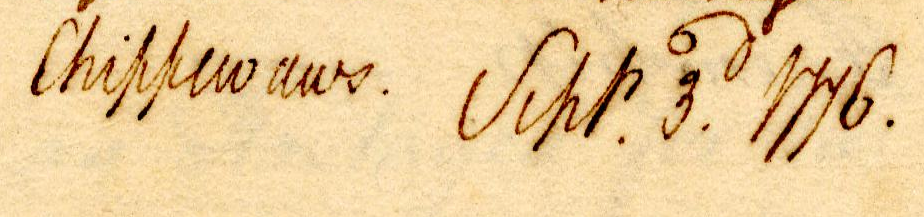Chippewaws. Sept^r. 3^d. 1776.
